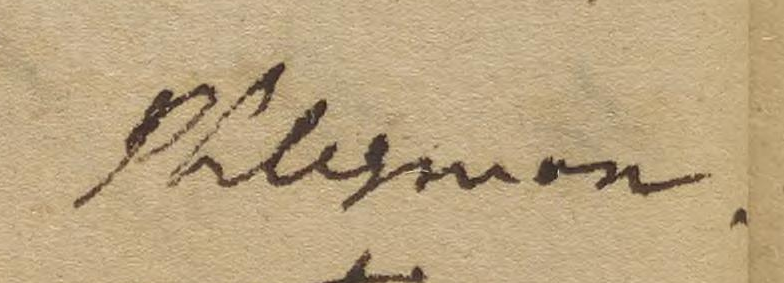Phlegm on
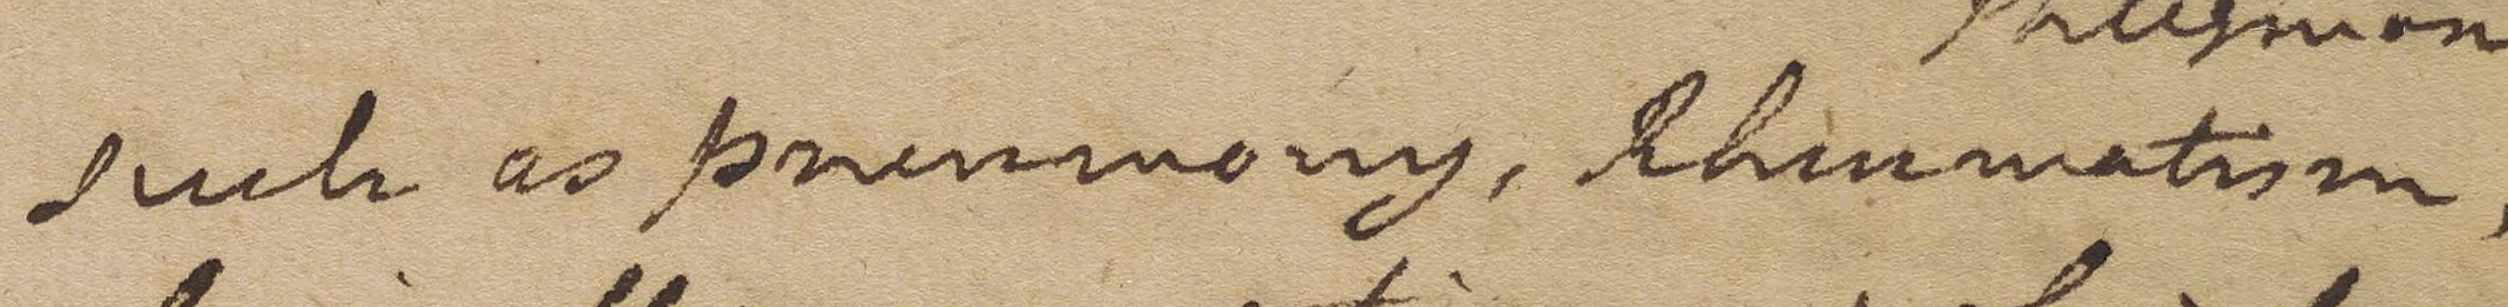such as pneumony, Rheumatism
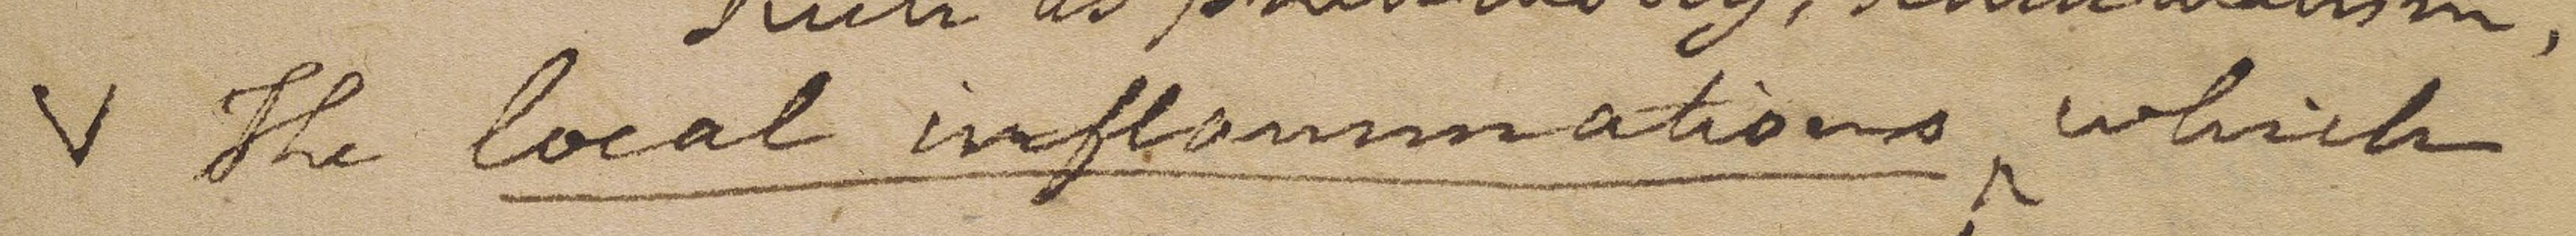V The local inflammations ^ which
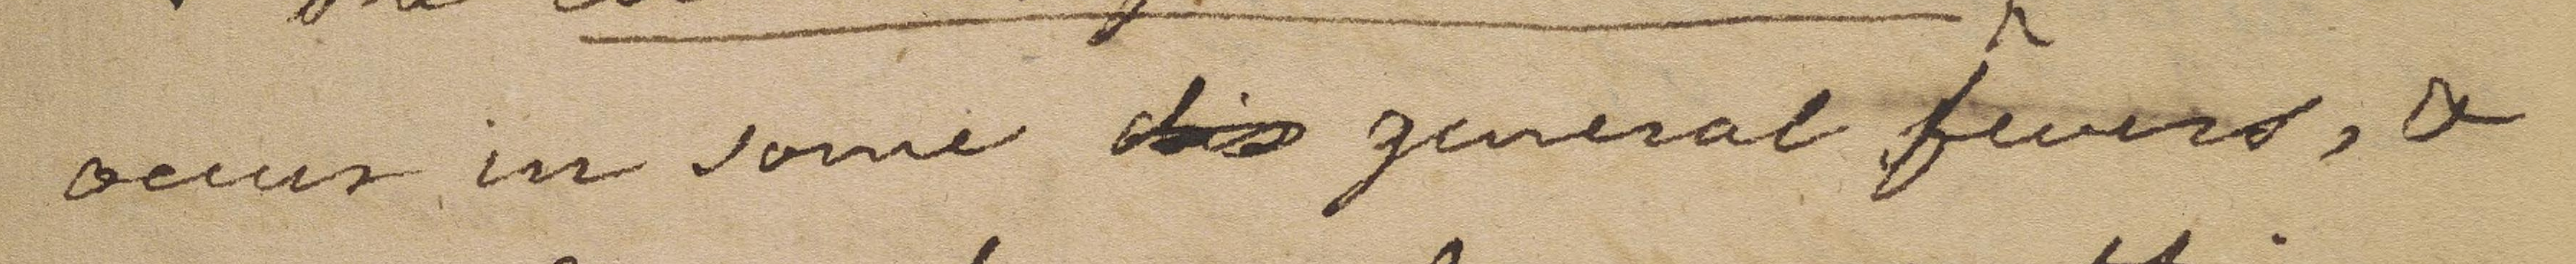occur in some [dis] general fevers, &
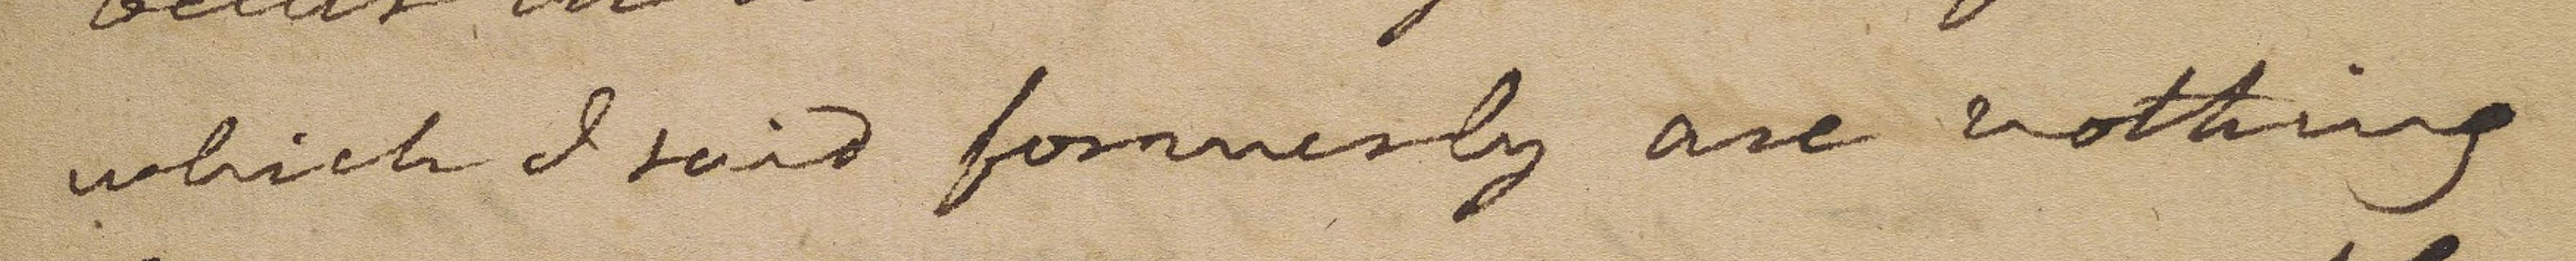which I said formerly are nothing
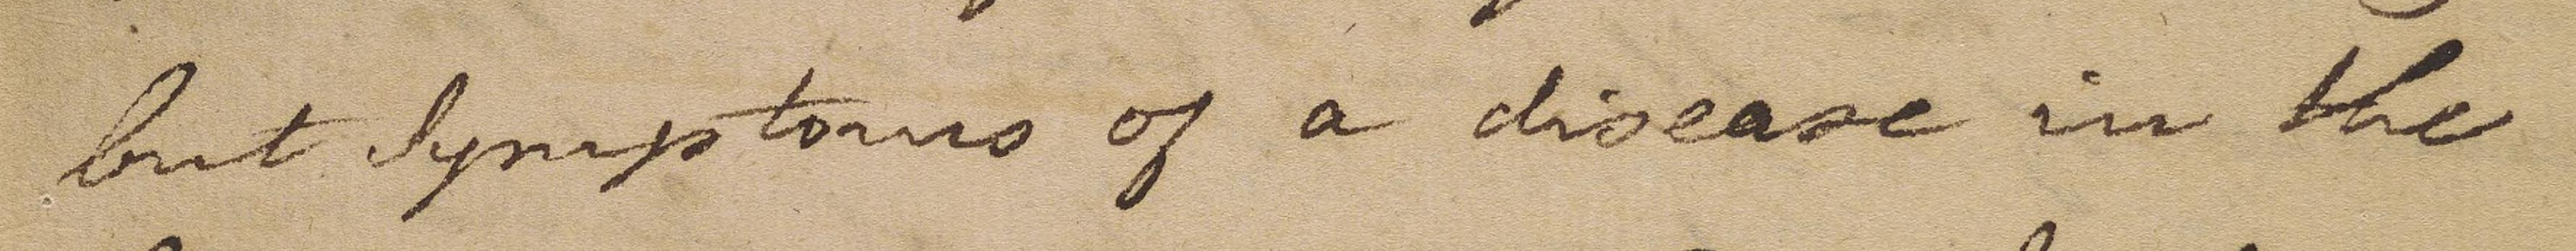but symptoms of a disease in the
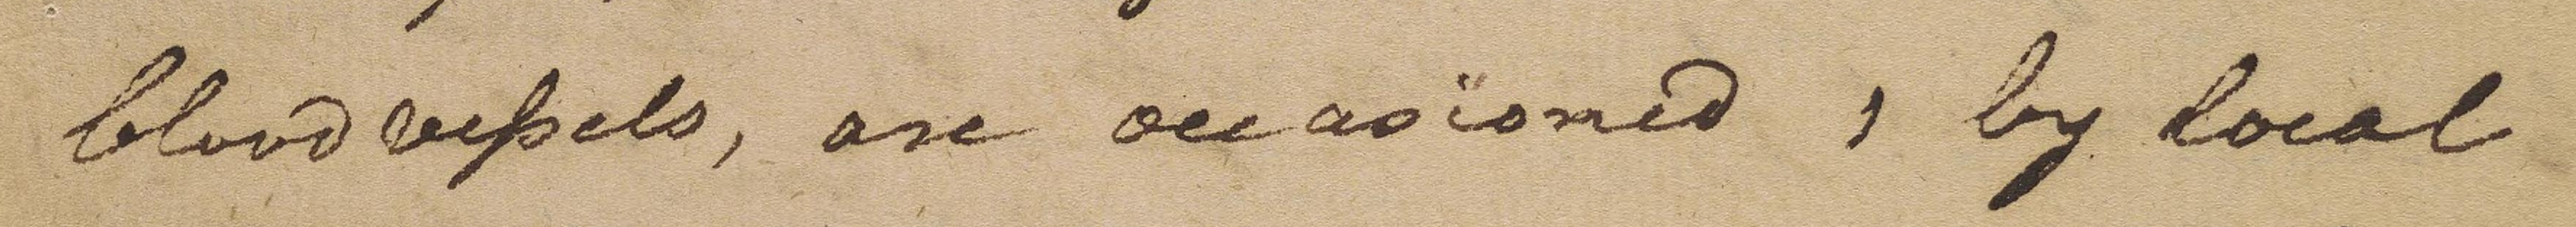blood expels, are occasioned, by local
